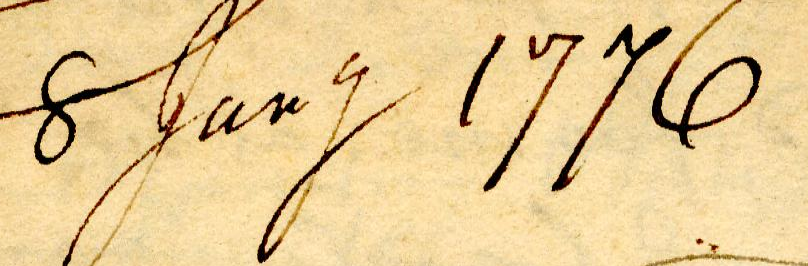8 Jan^y 1776
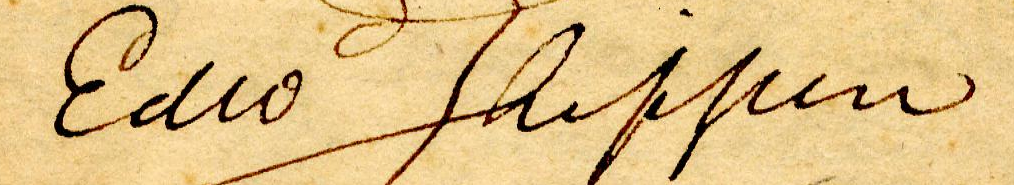Edw^d Shippen
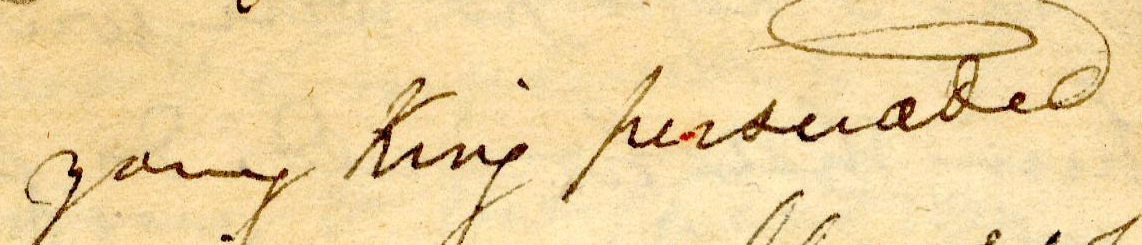young King persuaded
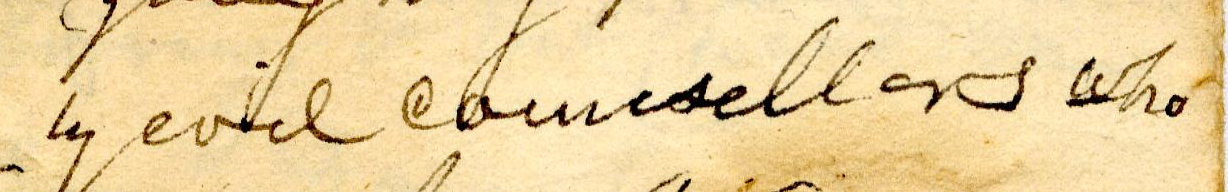by evil counsellors who
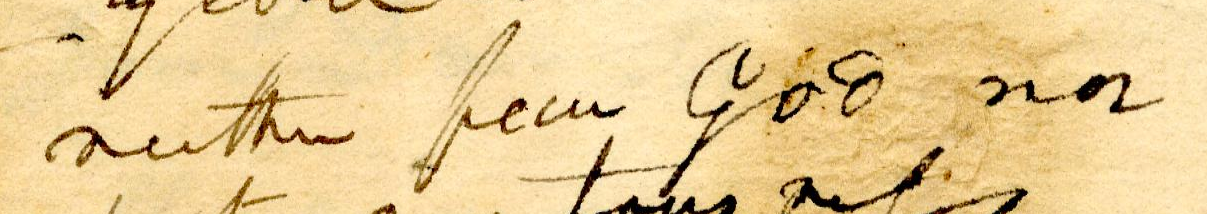neither fear God nor
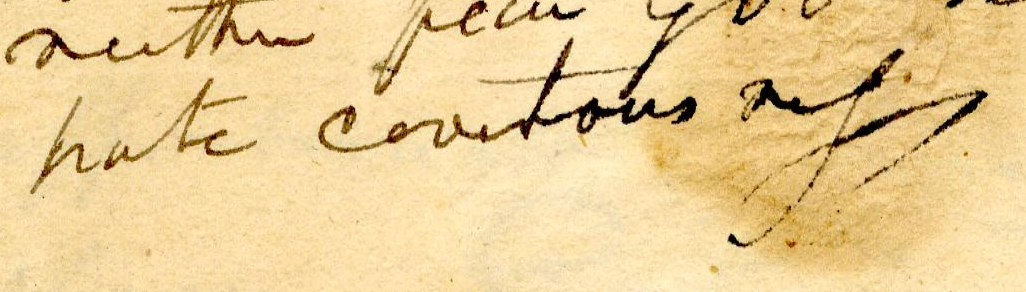hate covetousness
